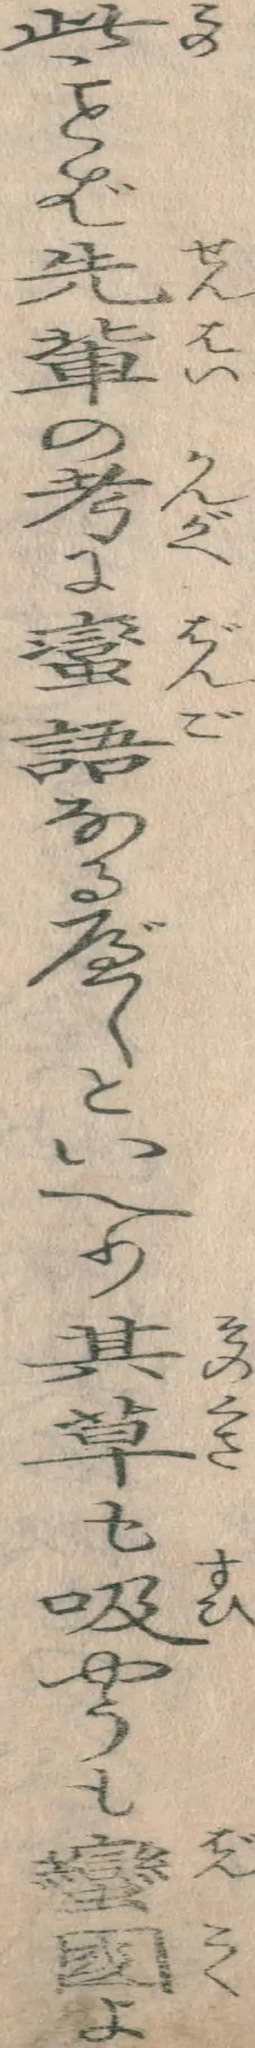此ことば先輩の考に蛮語なるべしといへり草其も吸やうも蛮国よ
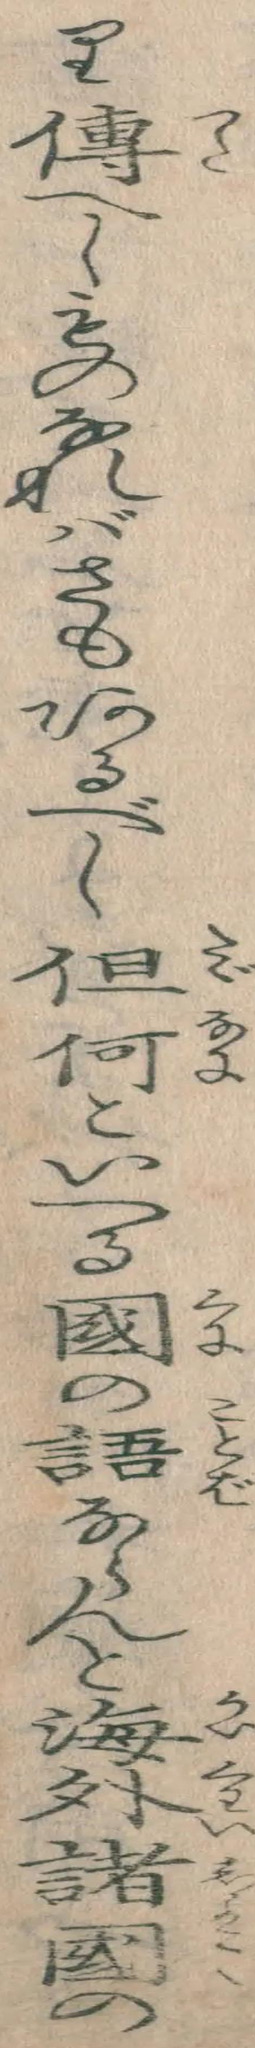り伝へしものなればさもあるべし但何といへる国の語ならんと海外諸国の

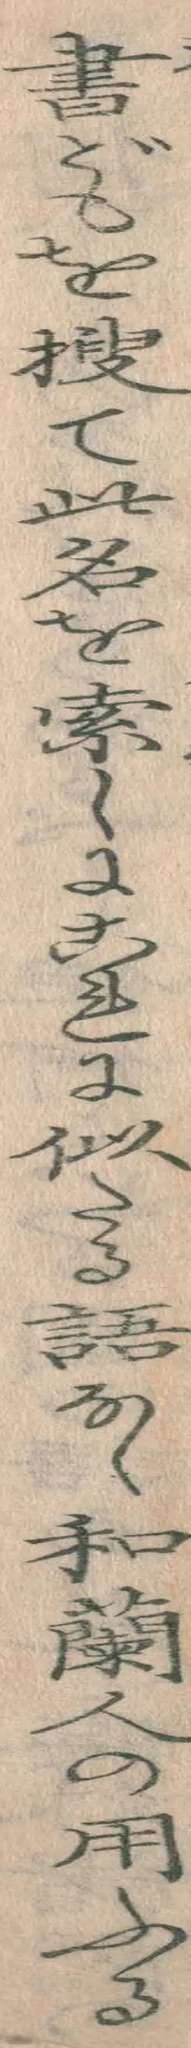書どもを捜て此名を索しにこれに似たる語なし和蘭人の用ふる
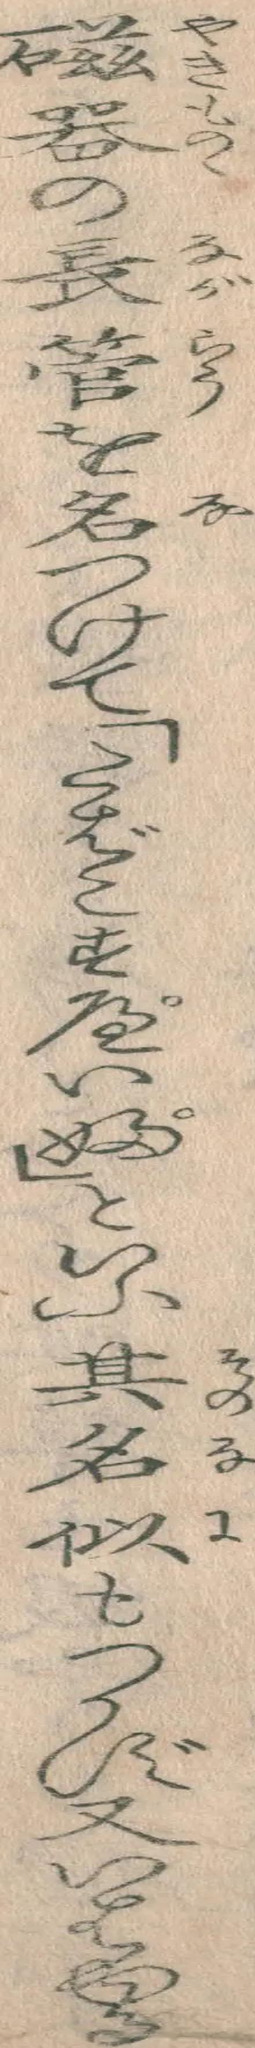磁器の長管を名つけて「たばこすぺいぷ」といふ其名似もつうず又いはゆる
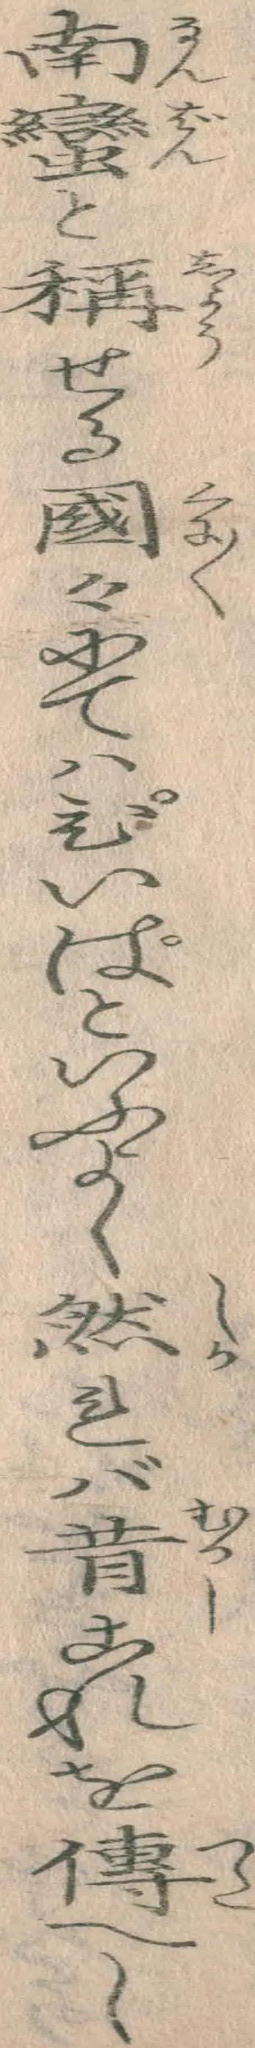南蛮と称せる国々にてはぴいぱといふよし然れば昔これを伝へし
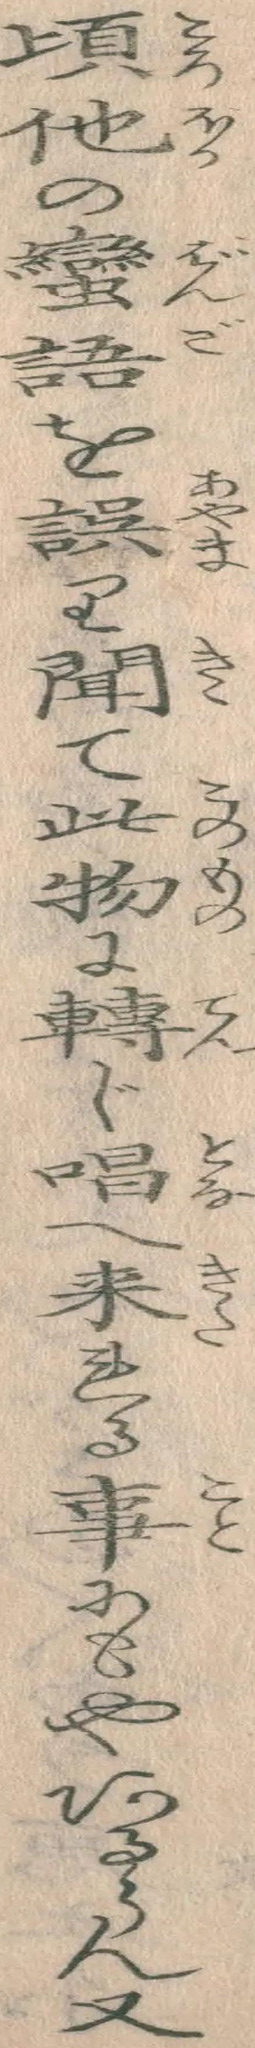頃他の蛮語を誤り聞て此物に転じ唱へ来れる事にもやあるらん又
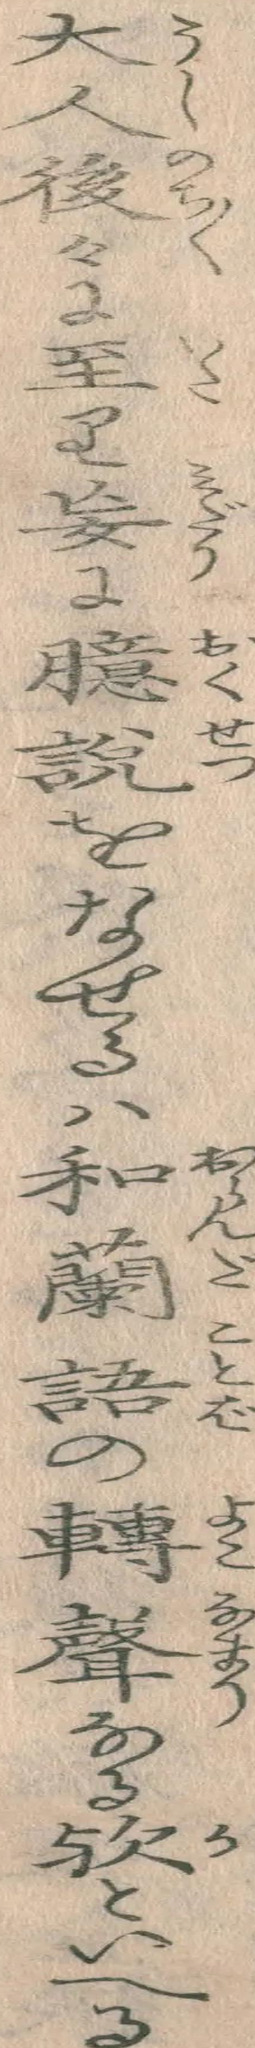大人後々に至り妄に臆説をなせるは和蘭語の転声なる歟といへる
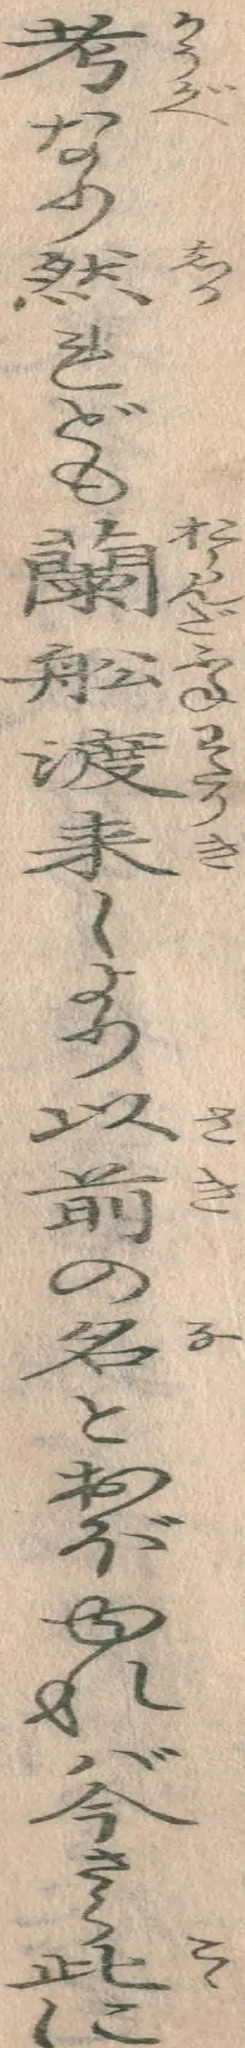考なり然れども蘭船渡来しより以前の名とおぼゆれば今さら此に
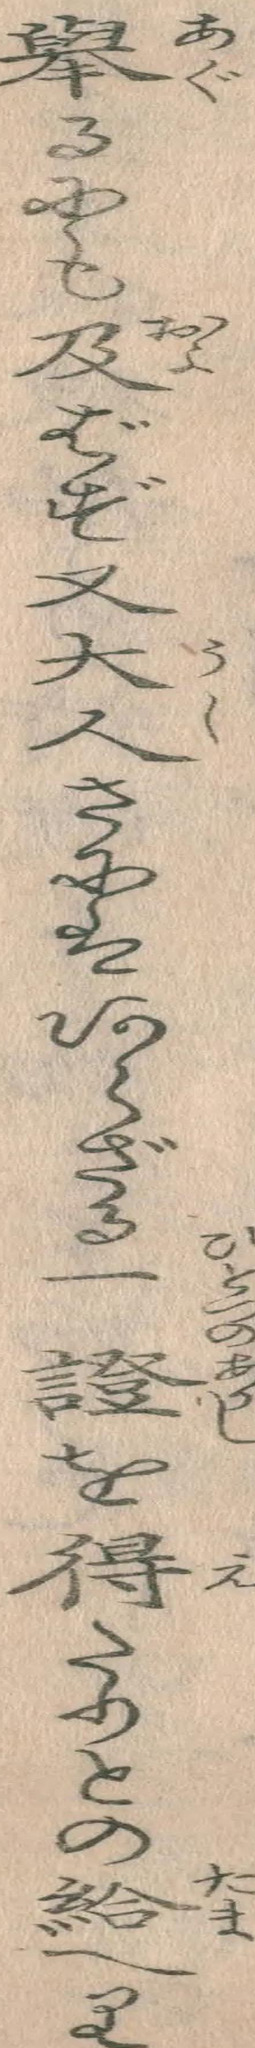挙るにも及ばず又大人さにはあらざる一証を得たりとの給へり
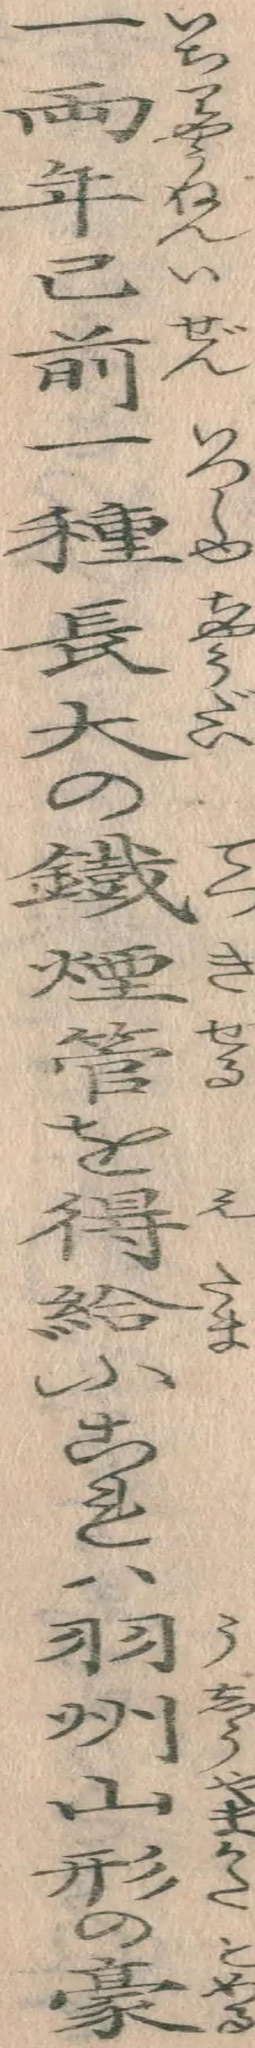一両年已前一種長大の鉄煙管を得給ふこれは羽州山形の豪
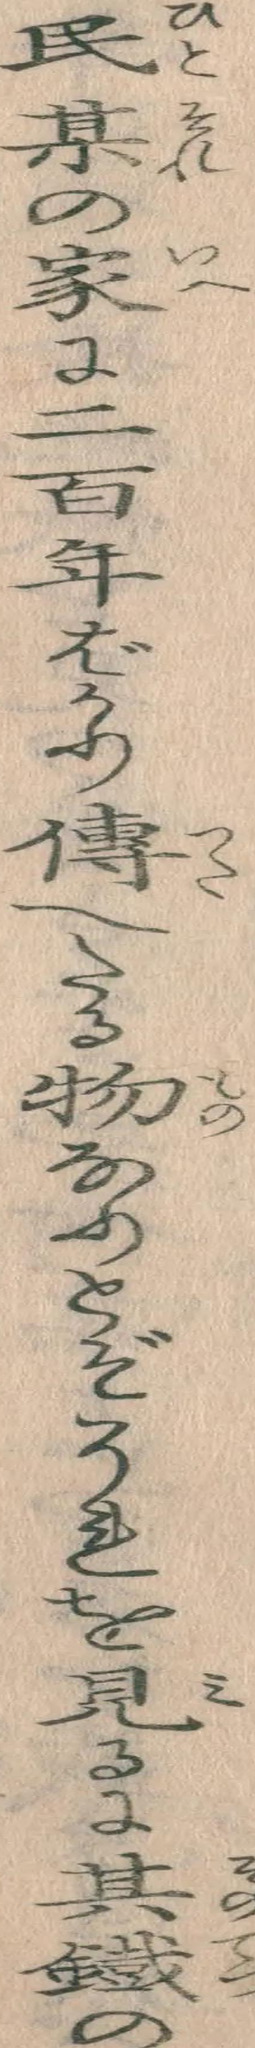民某の家に二百年ばかり伝へたる物なりとぞそれを見るに其鉄の
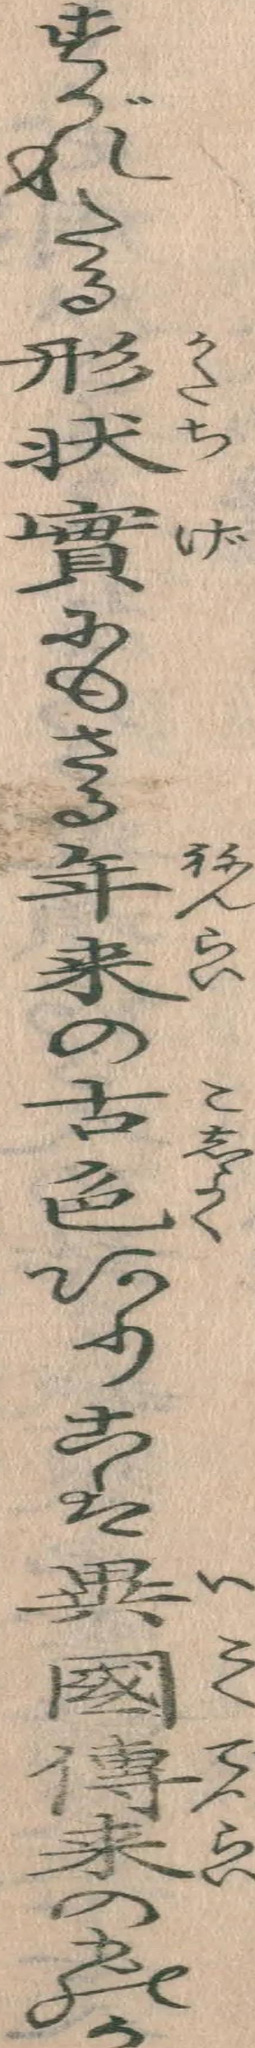すぐれたる形状実にもさる年来の古色ありこは異国伝来のものか
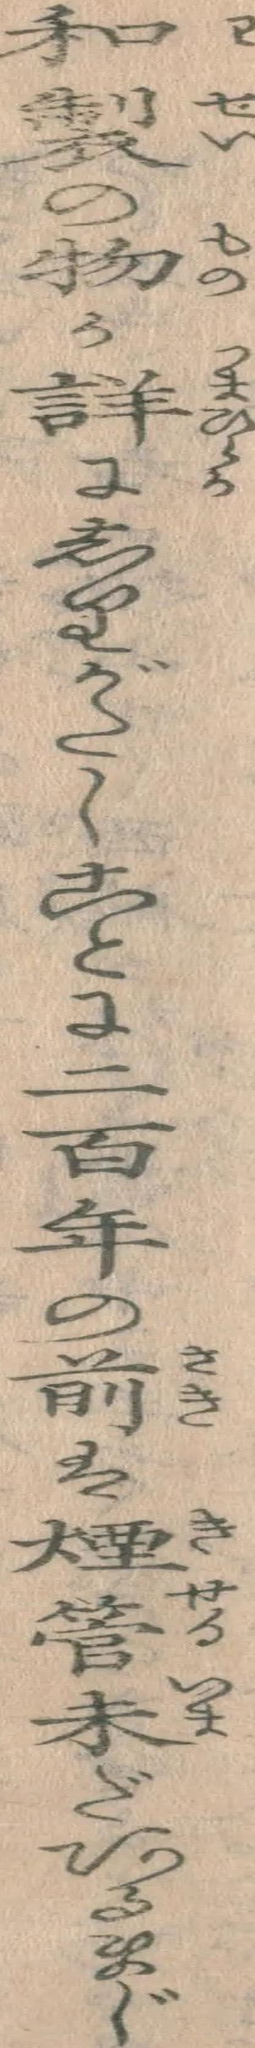和製の物か詳にしりがたしことに二百年の前は煙管未だあるまじ
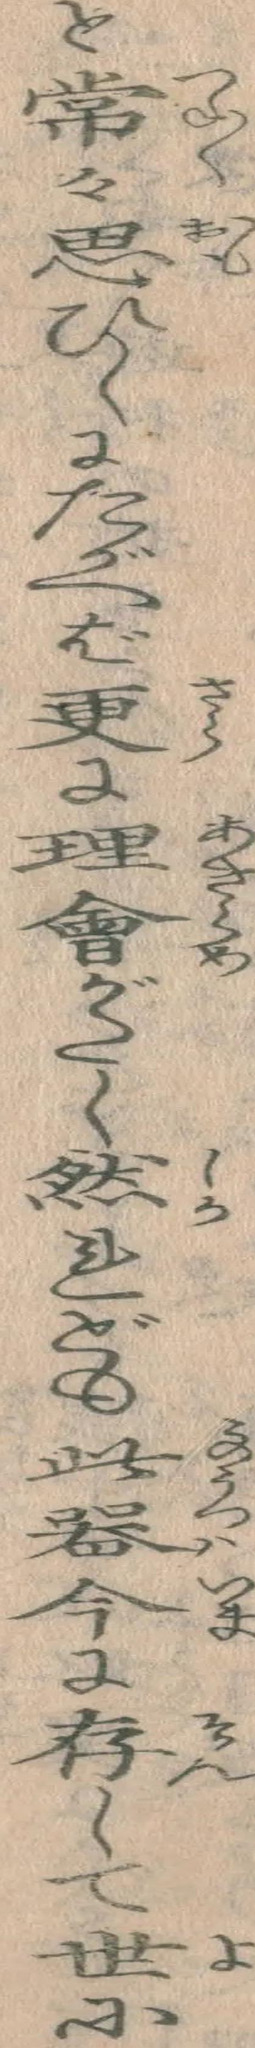と常々思ひしにたがへば更に理会がたし然れども此器今に存して世に
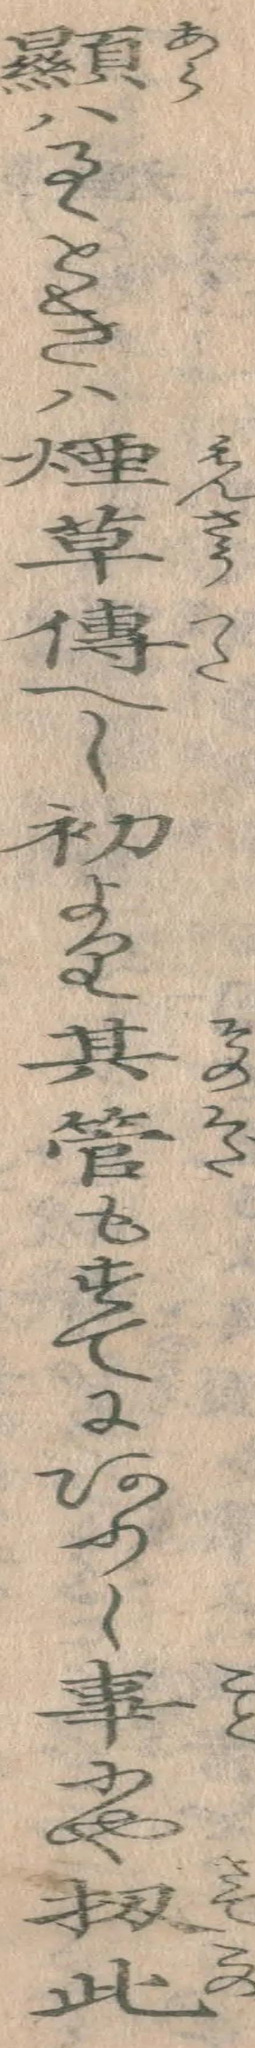顕はるゝときは煙草伝へし初より其管もすてにありし事にや扨此
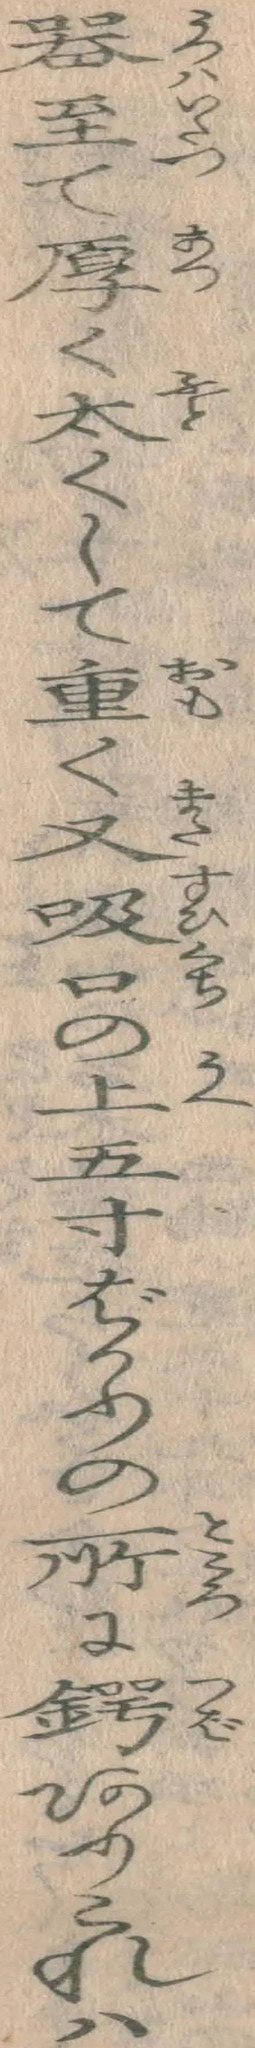器至て厚く太くして重く又吸口の上五寸ばかりの所に鍔ありこれは
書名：目さまし草
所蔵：国立国会図書館 National Diet Library, JAPAN
